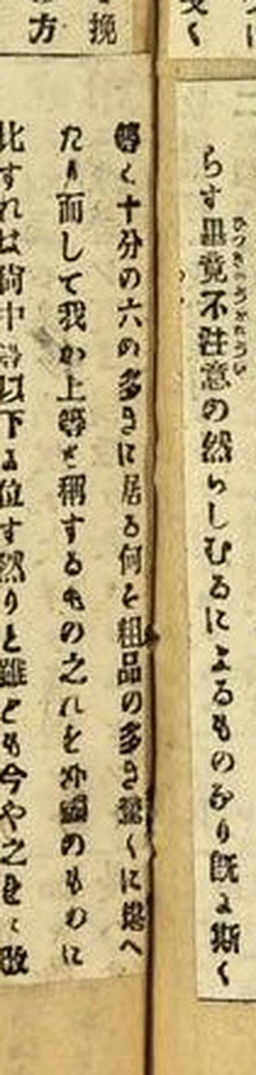等は十分の六の多きに居る何そ粗品の多き驚くに堪へ
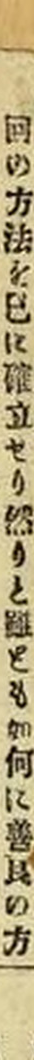回の方法を已に確立せり然りと雖とも如何に善良の方
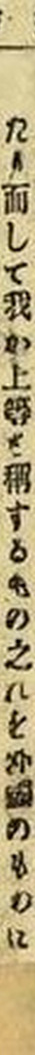たり而して我か上等と称するもの之れを外国のものに
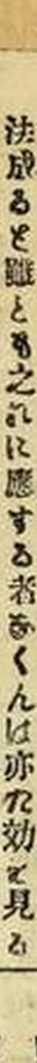法成ると雖とも之れに応する者なくんは亦た効を見る
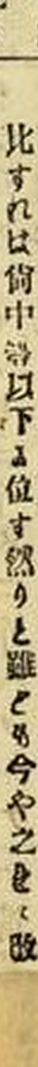比すれは尚中等以下に位す然りと雖とも今や之れに改
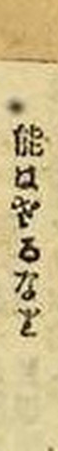能はざるなり
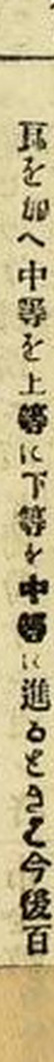良を加へ中等を上等に下等を中等に進るときは今後百
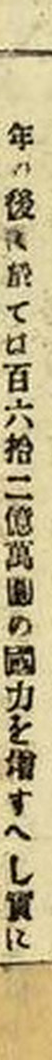年の後に於ては百六拾二億万円の国力を増すへし実に
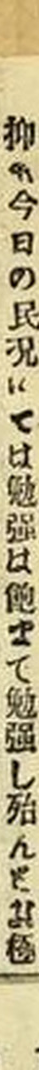抑も今日の民況にては勉強は飽まて勉強し殆んど其極
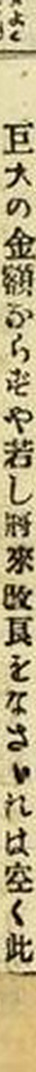巨大の金額ならずや若し将来改良をなさゞれは空く此
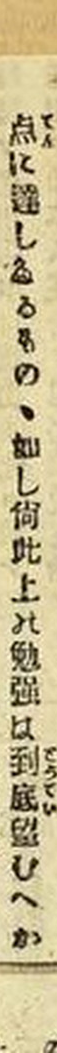点に達したるものゝ如し尚此上の勉強は到底望むへか
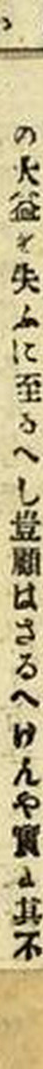の大益を失ふに至るへし豈願はさるへけんや実に其不
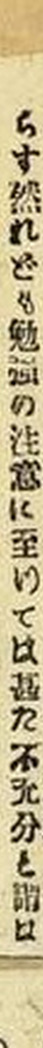らす然れども勉強の注意に至つては甚た不充分と謂は
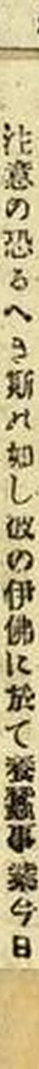注意の恐るへき斯の如し彼の伊仏に於て養蚕事業今日
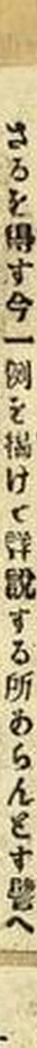さるを得す今一例を掲けて詳説する所あらんとす譬へ
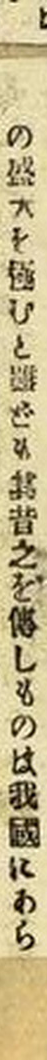の盛大を極むと雖ども其昔之を伝しものは我国にあら
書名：温古集 五巻
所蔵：福井県文書館 Fukui Prefectural Archives
